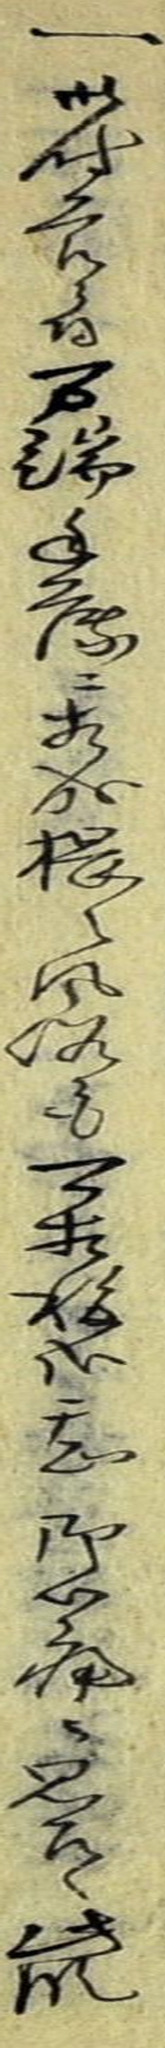一御時節ニ付万端手薄ニ相成猥之風俗ニも可相移哉甚御心痛ニ思召候此段
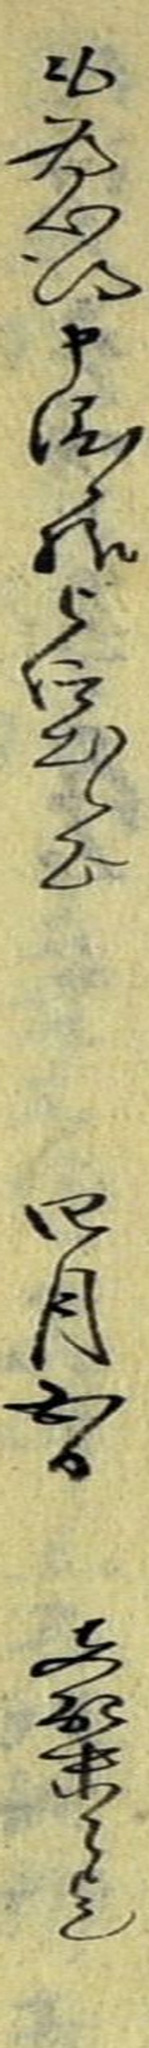も為心得申渡候様被仰出候以上四月五日支配末々迄

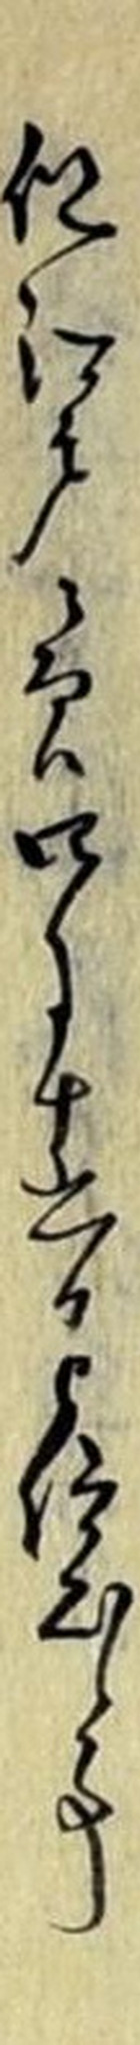但江戸ニ而ハ四月十六日被仰出候事
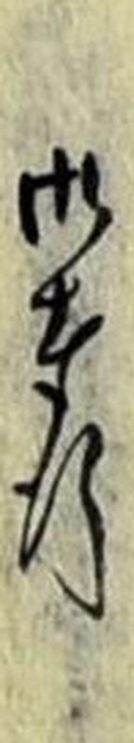御奉行
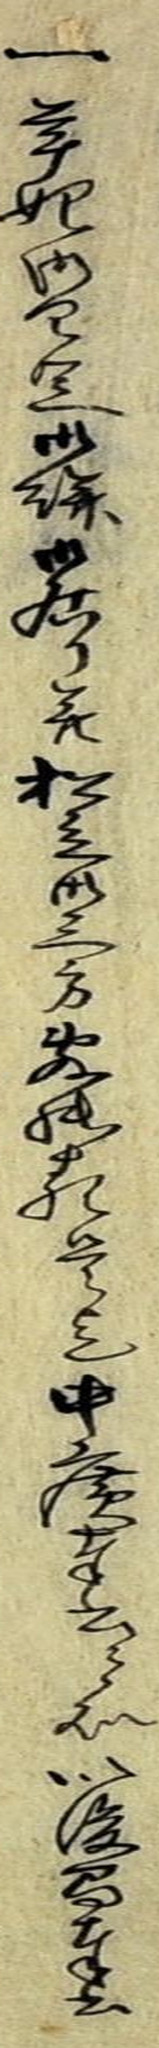一年始御具足御餅御居り并松立御三方敷紙類是迄中広奉書ニ候処以後間奉書
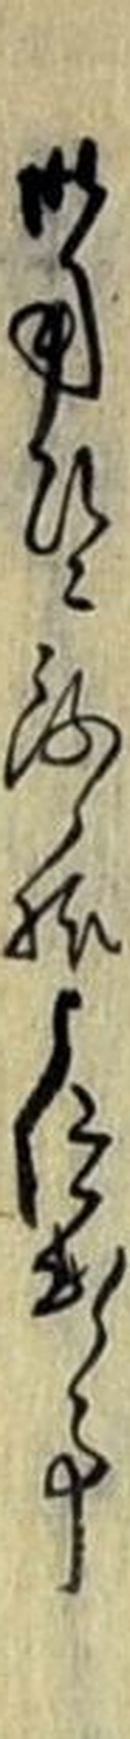御用ひニ致候様被仰出候事
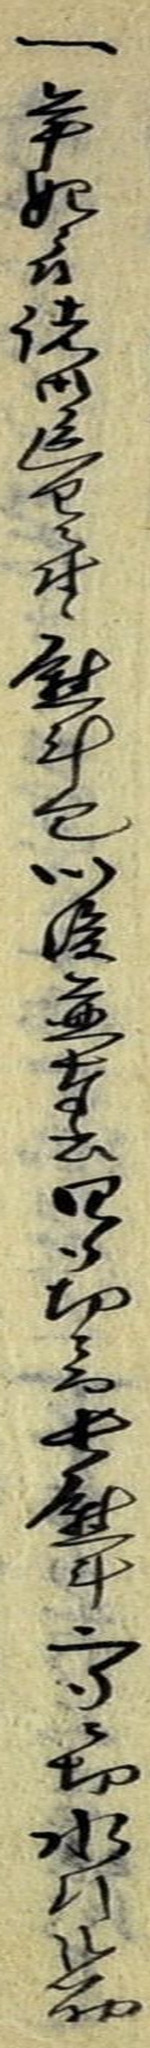一年始ニ付諸御道具ニ付候熨斗包以後並奉書四ツ切ニ而長熨斗二ツニ切水引弐筋
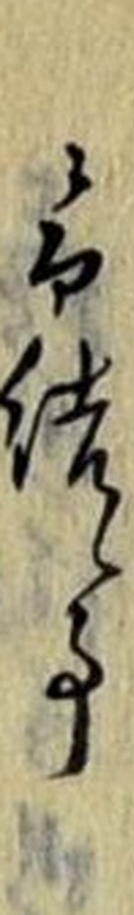ニ而結候事
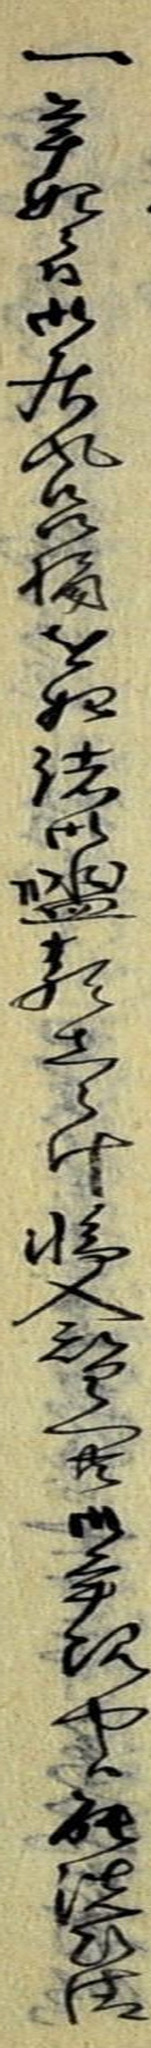一年始ニ付御居風呂桶を始諸御盥類しらけ？輪入替候へ共御年限中ハ能洗ひ清
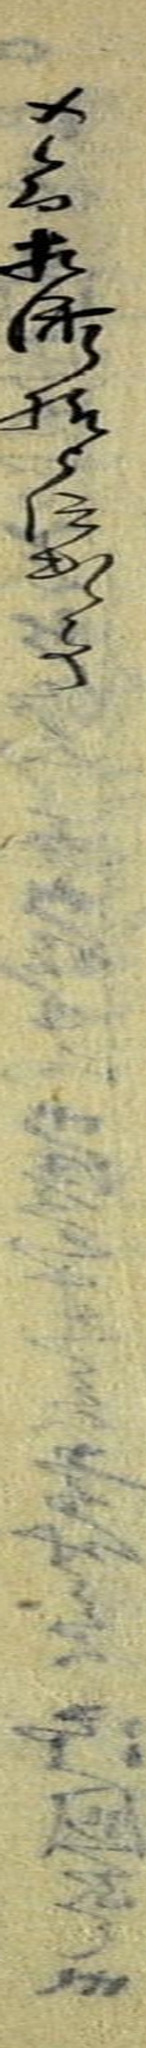メ候而相済候様被仰出候事
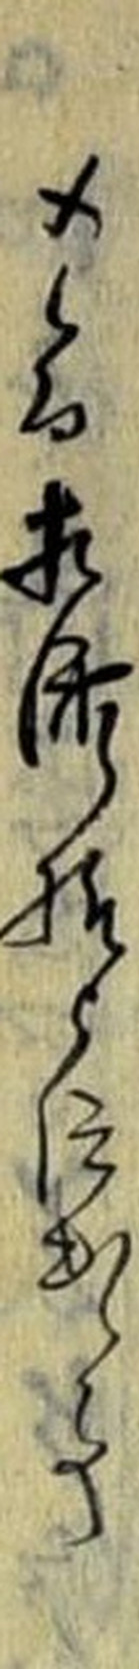メ候而相済候様被仰出候事
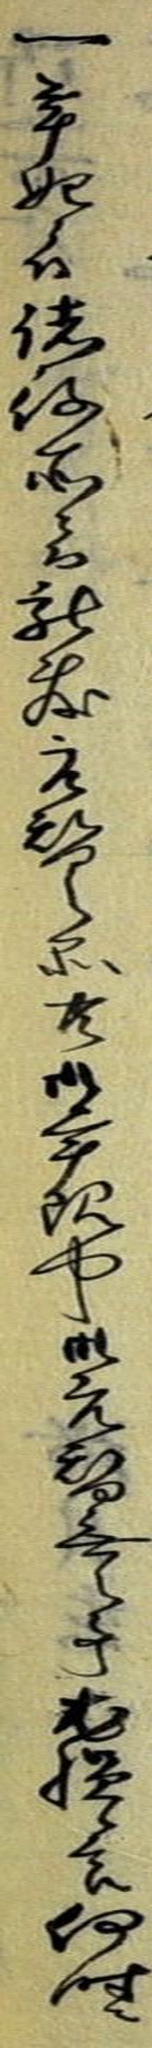一年始ニ付諸役所ニ而新敷取替之品共御年限中御取替無之事尤損候節何時ニ
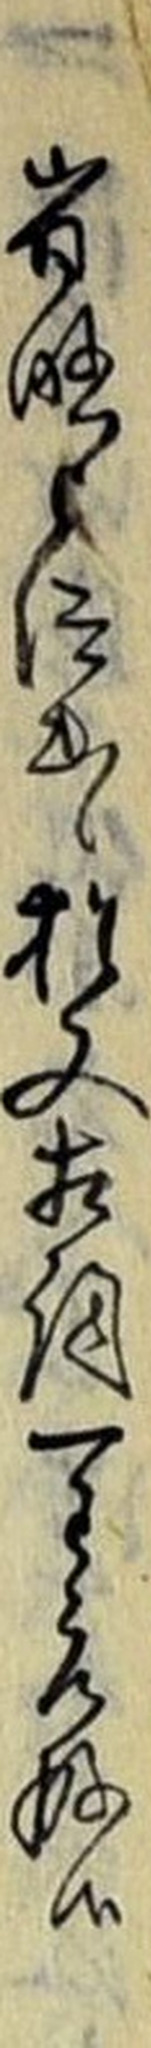省略被仰出候猶又相調可被取扱候
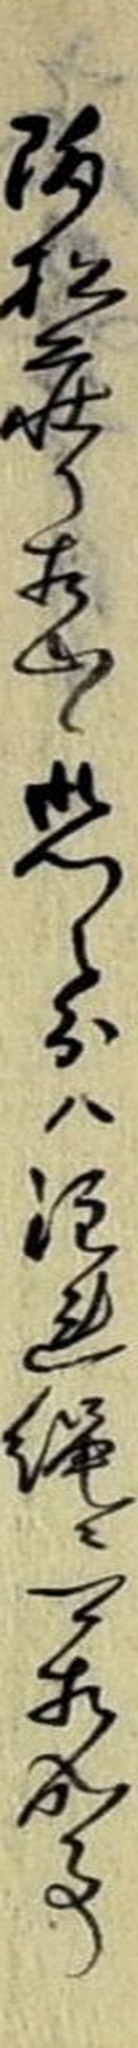付松荘り相止候御門之分ハ注連縄ニ可相成事
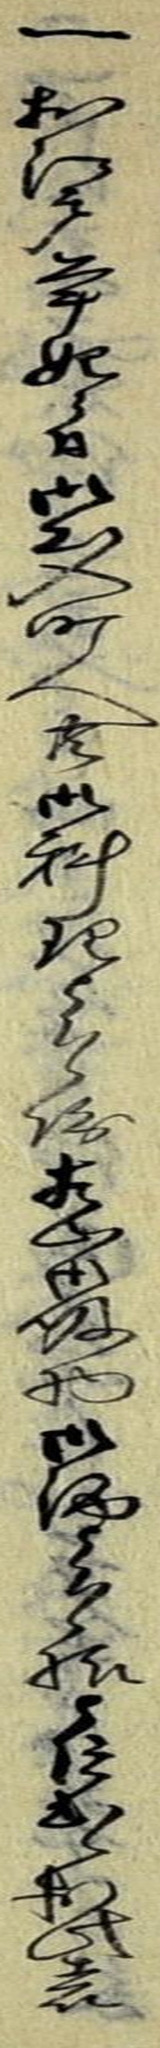一於江戸年始ニ付御出入町人共御料理被下候儀相止御吸物御酒被下候様被仰出候於此表
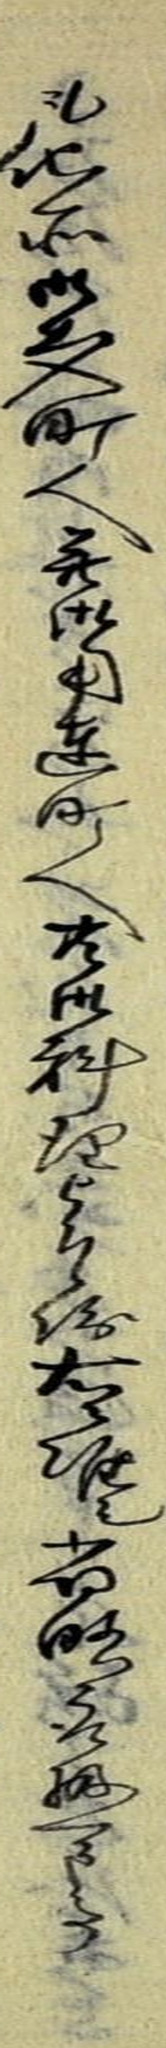も他所御出入町人并御用達町人共御料理被下候儀右ニ准シ省略取扱可申事
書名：命令之部 三
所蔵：福井県文書館 Fukui Prefectural Archives
